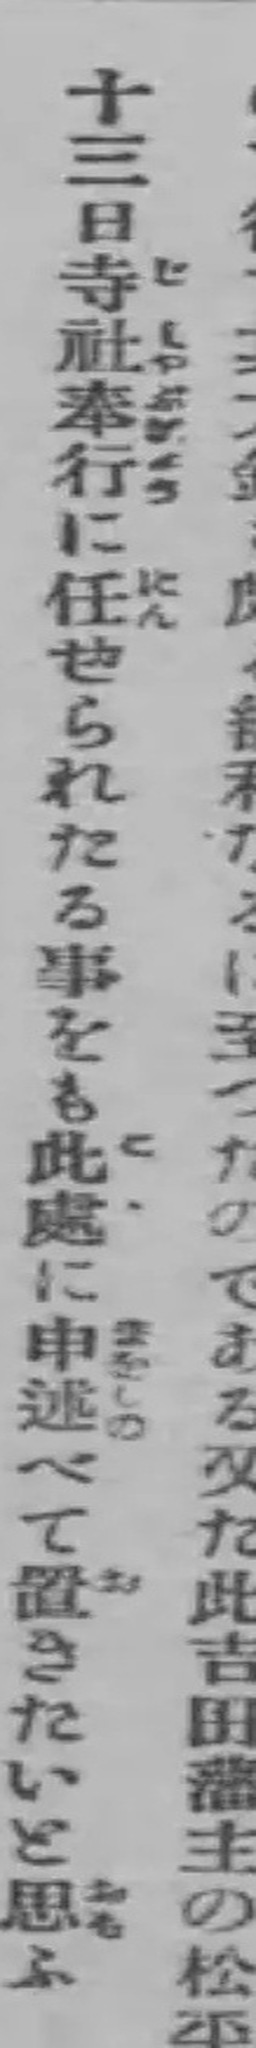十三日寺社奉行に任ぜられたる事をも此処に申述べて置きたいと思ふ
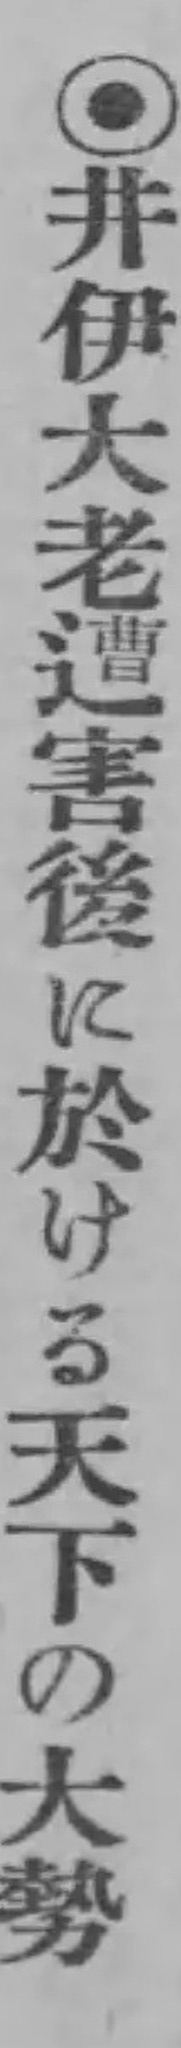⦿井伊大老遭害後に於ける天下の大勢
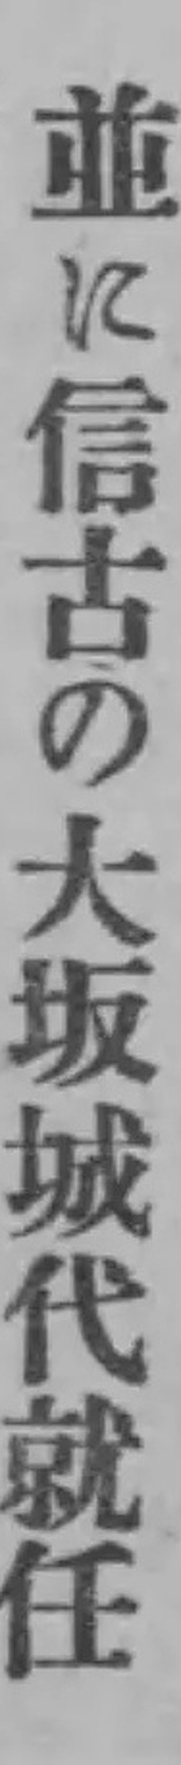並に信古の大坂城代就任
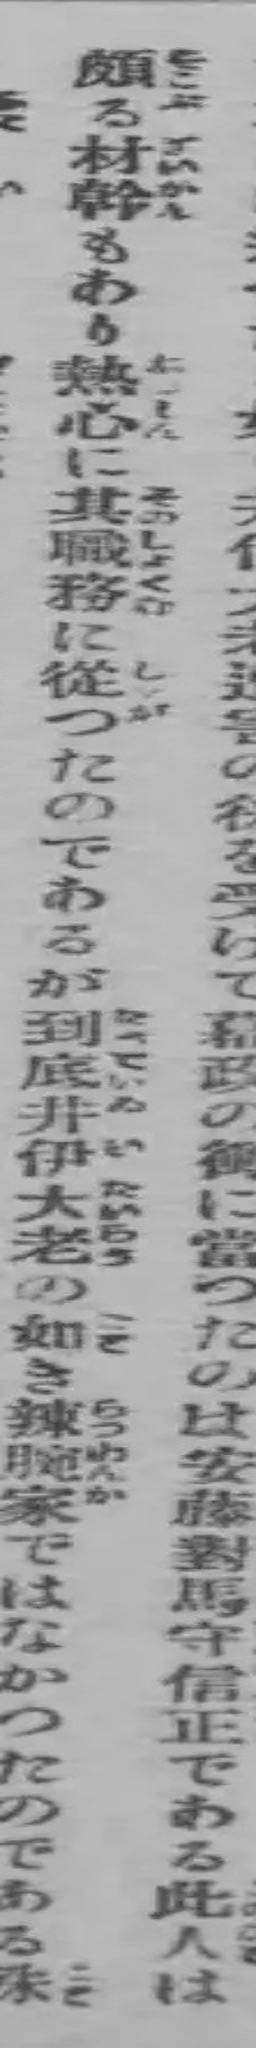頗る材幹もあり熱心に其職務に従つたのであるが到底井伊大老の如き辣腕家ではなかつたのである殊
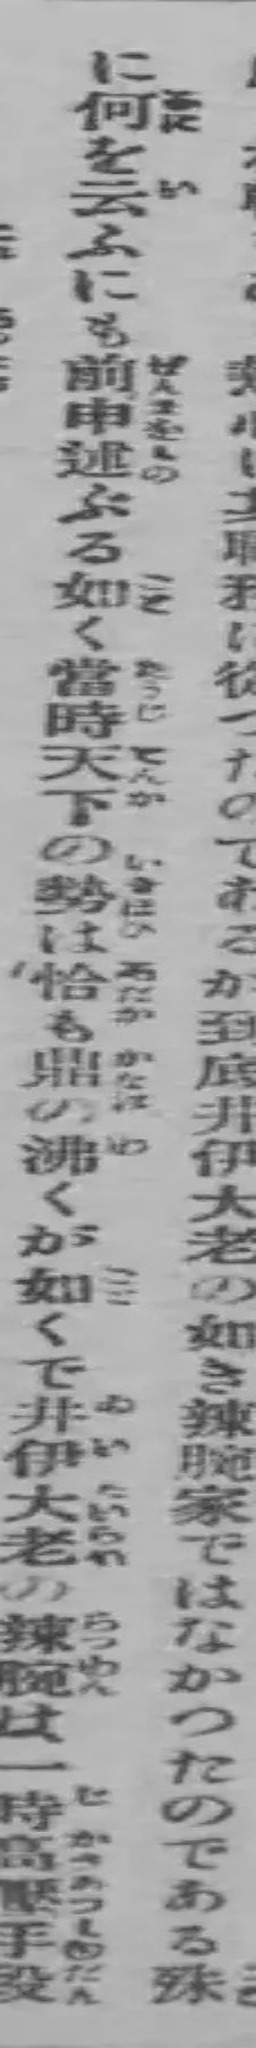に何を云ふにも前申述ぶる如く当時天下の勢は恰も鼎の沸くが如くで井伊大老の辣腕は一時高圧手段
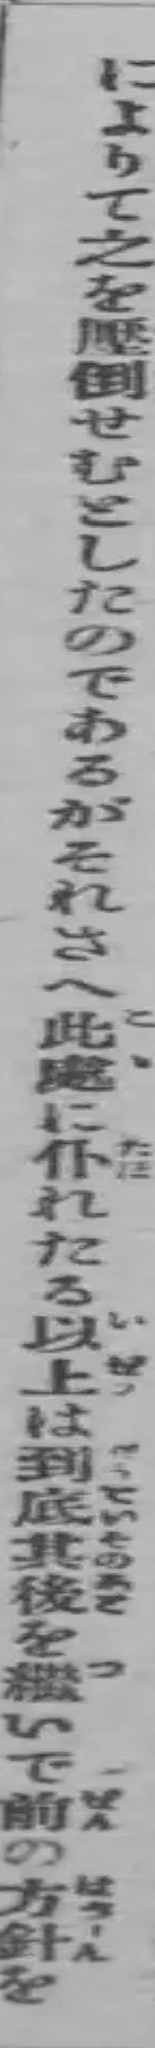によりて之を圧倒せむとしたのであるがそれさへ此処に仆れたる以上は到底其後を継いで前の方針を
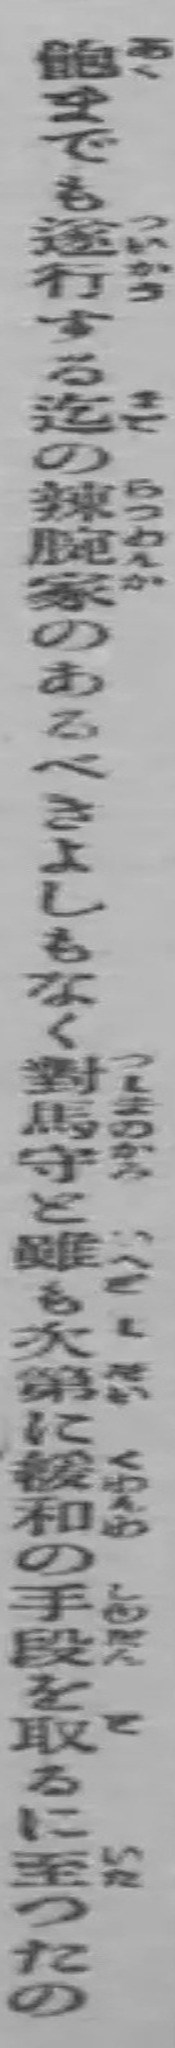飽までも遂行する迄の辣腕家のあるべきよしもなく対馬守と雖も次第に緩和の手段を取るに至つたの
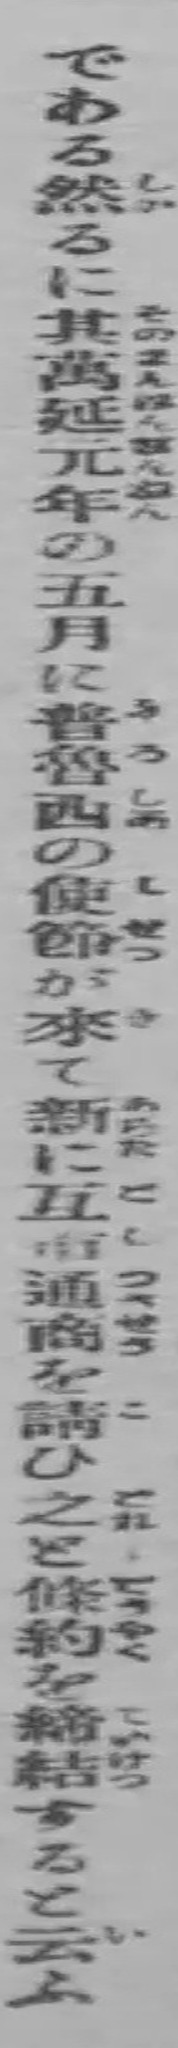である然るに其万延元年の五月に普魯西の使節が来て新に互市通商を請ひ之と条約を締結すると云ふ
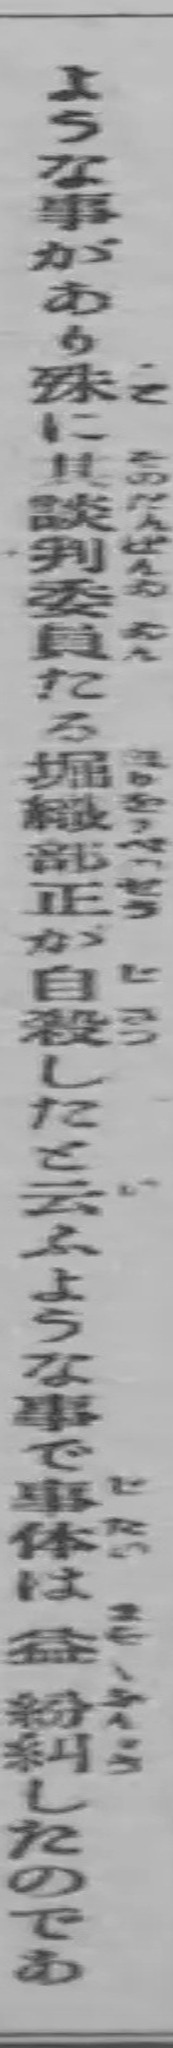ような事があり殊に其談判委員たる堀織部正が自殺したと云ふような事で事体は益紛糾したのであ
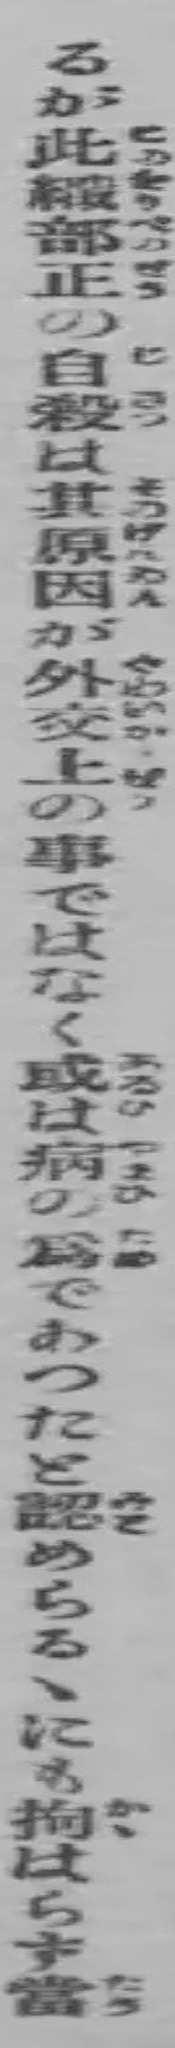るが此織部正の自殺は其原因が外交上の事ではなく或は病の為であつたと認めらるゝにも拘はらず当
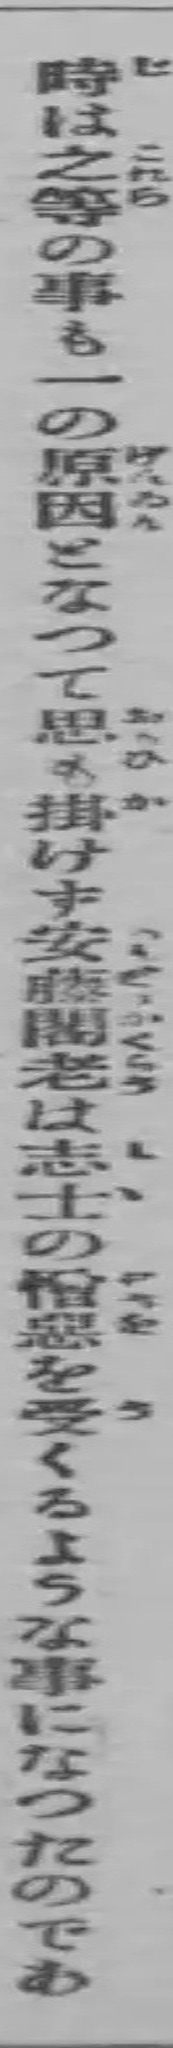時は之等の事も一の原因となつて思ひも掛けず安藤閣老は志士の憎悪を受くるような事になつたのであ
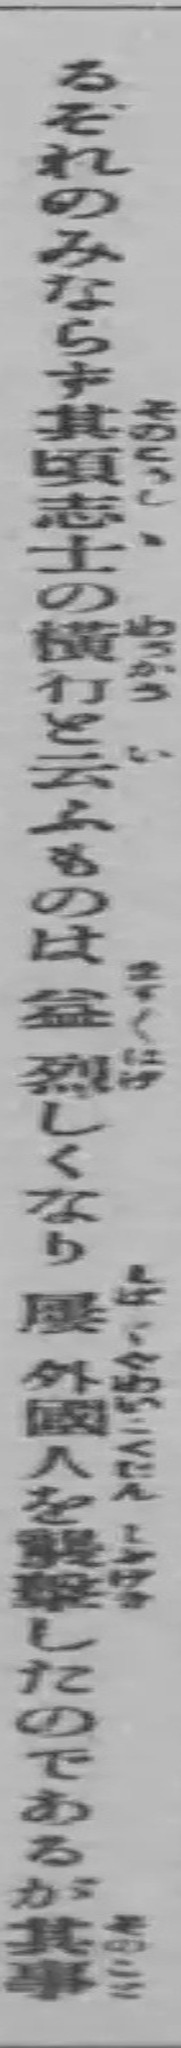るそれのみならず其頃志士の横行と云ふものは益烈しくなり屡外国人を襲撃したのであるが其事
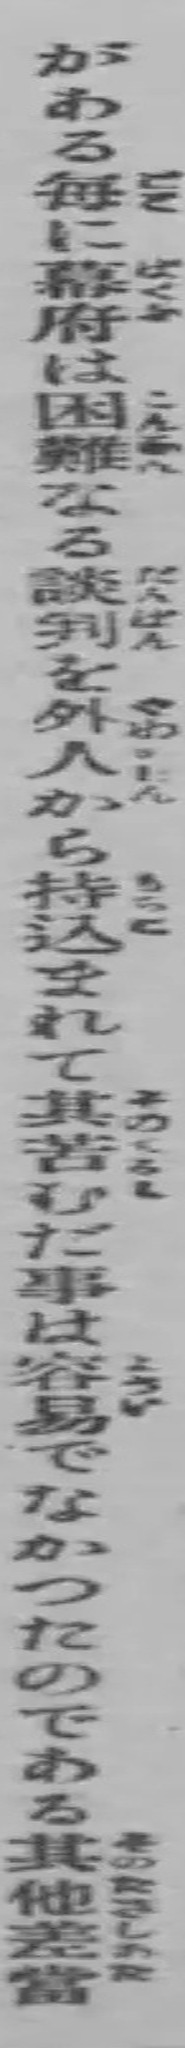がある毎に幕府は困難なる談判を外人から持込まれて其苦むだ事は容易でなかつたのである其他差当
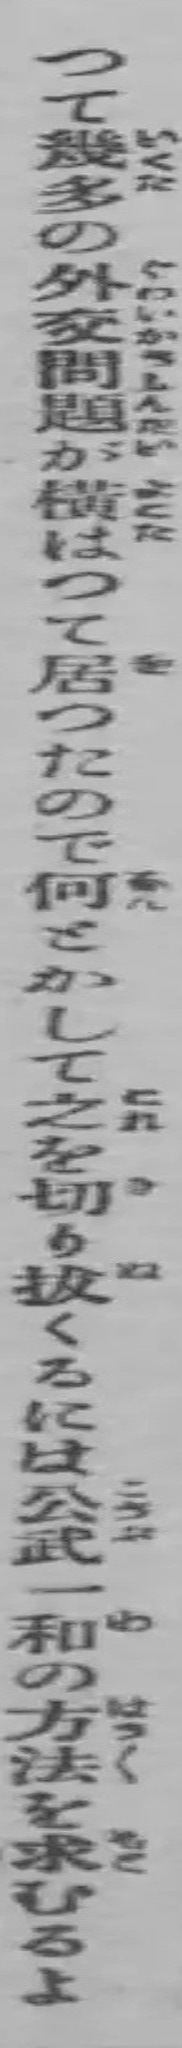つて幾多の外交問題が横はつて居つたので何とかして之を切り抜くるには公武一和の方法を求むるよ
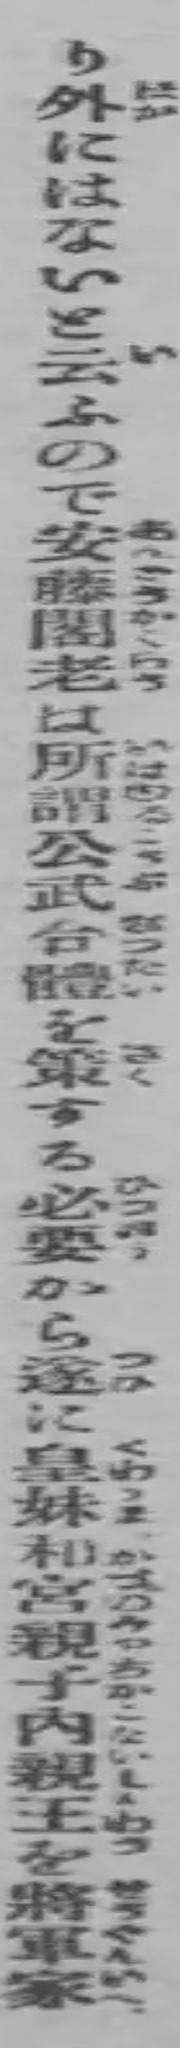り外にはないと云ふので安藤閣老は所謂公武合体を策する必要から遂に皇妹和宮親子内親王を将軍家
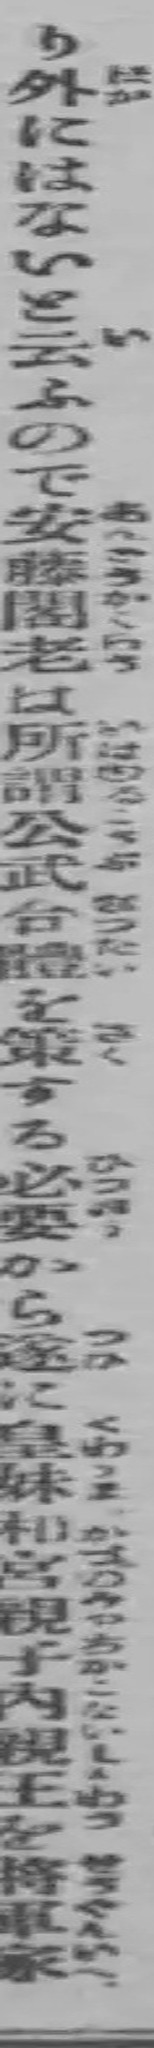り外にはないと云ふので安藤閣老は所謂公武合体を策する必要から遂に皇妹和宮親子内親王を将軍家
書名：豊橋市史談
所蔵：国立国会図書館 National Diet Library, JAPAN
